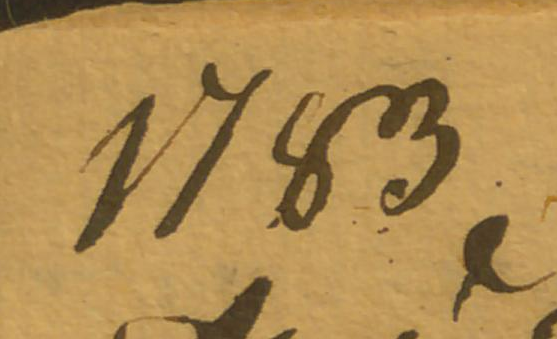1783
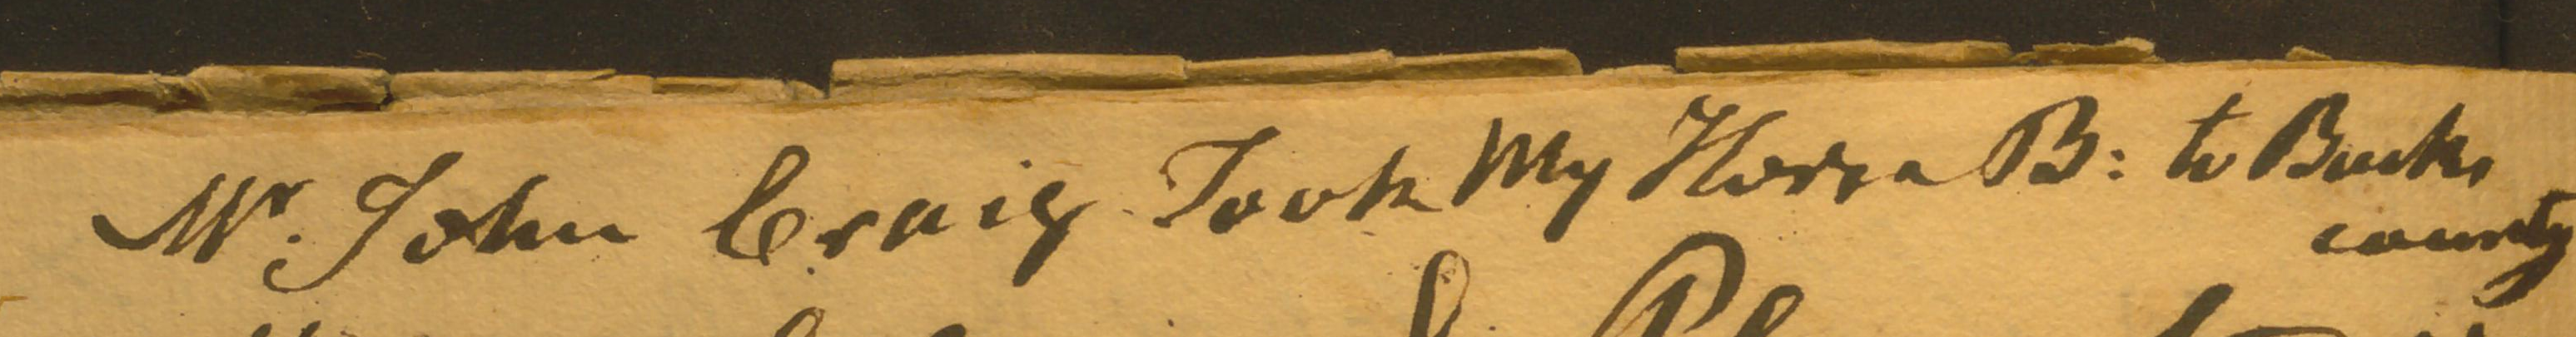M^r. John Craig Took My Horse B. to Bucks
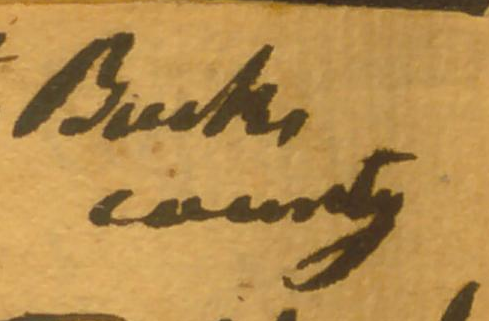county
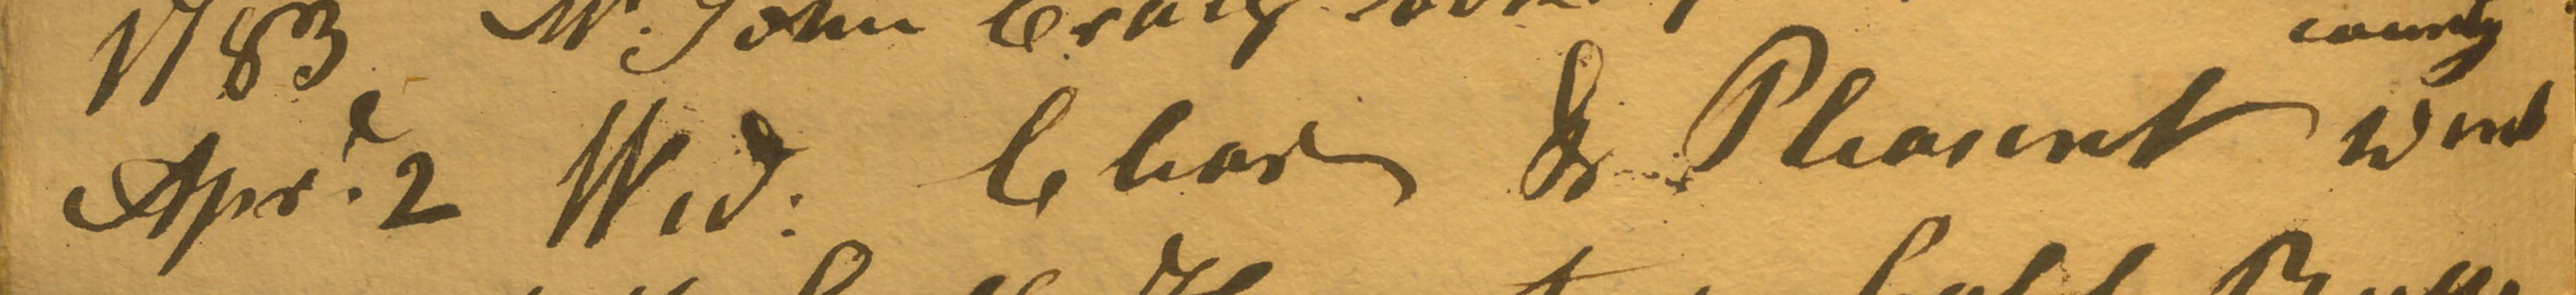Apr^l. 2 Wed: Clear & Pleasent went
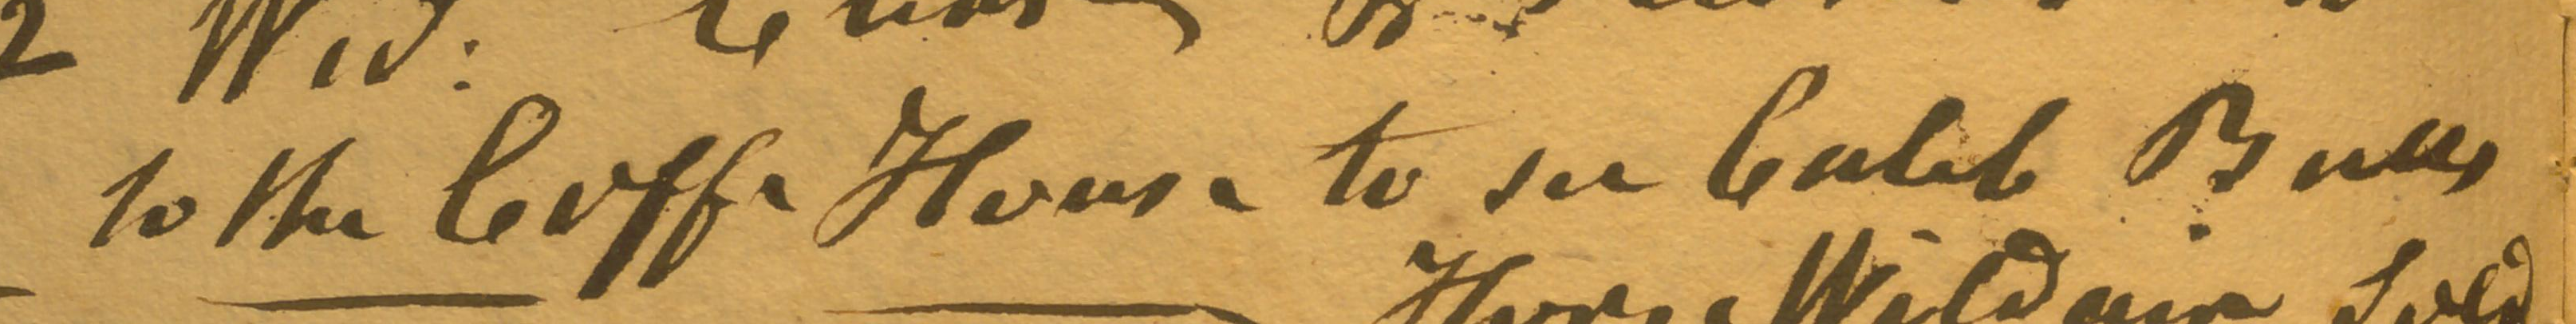to the Coffe House to see Caleb Bulls
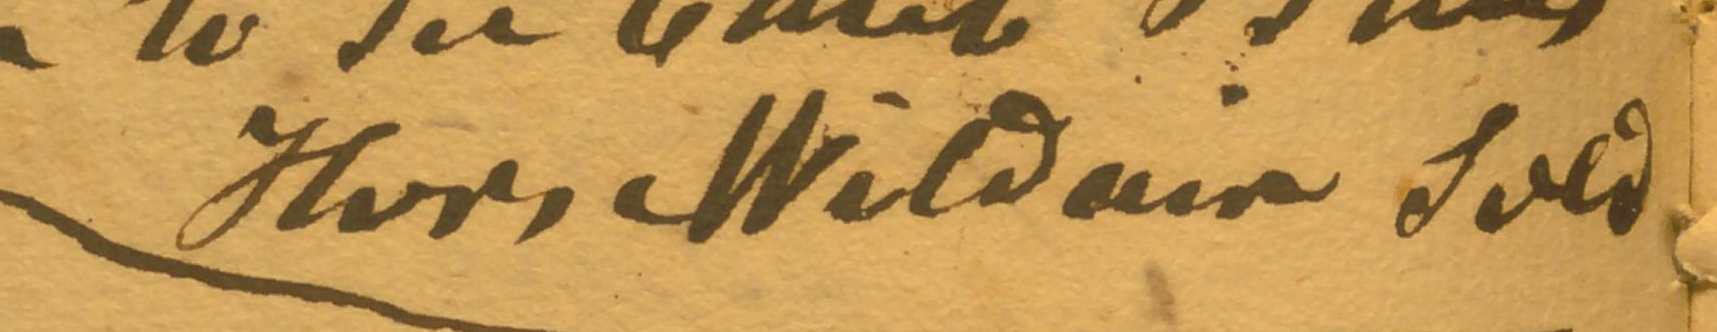Horse Wildam Sold
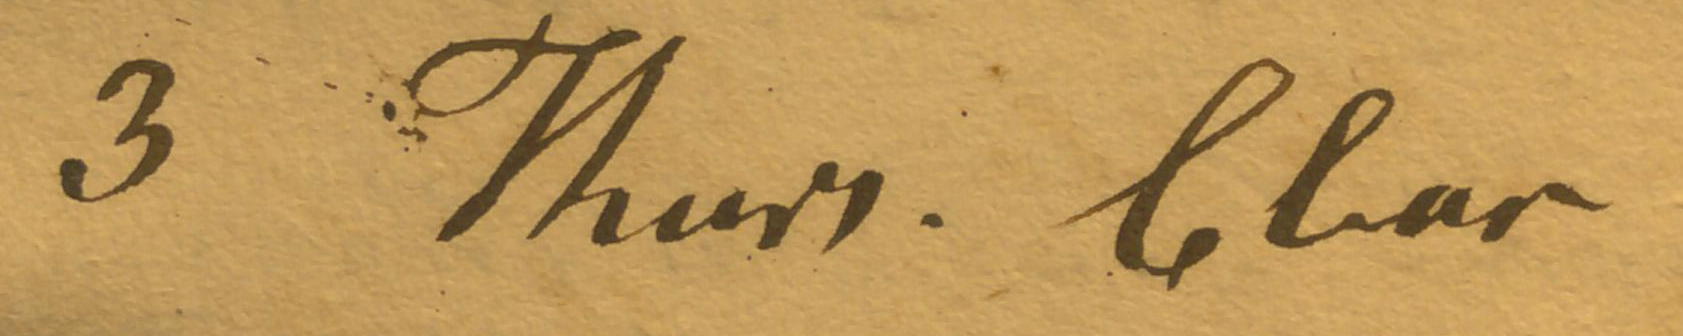3 Thurs. Clear
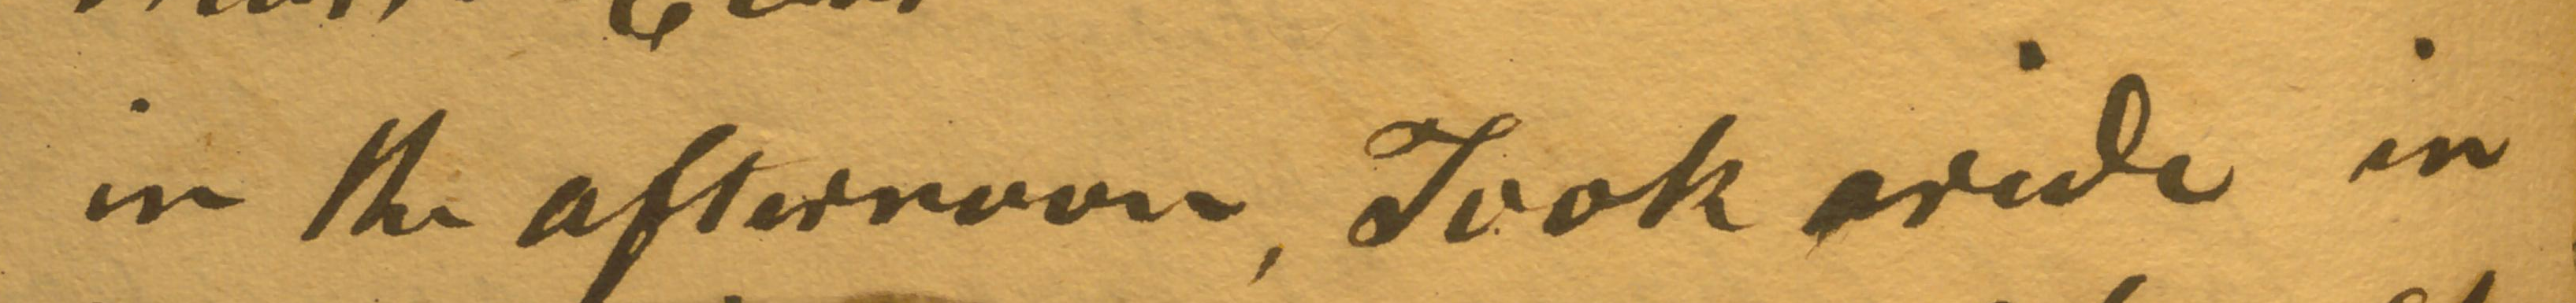in the afternoon Took a ride in
